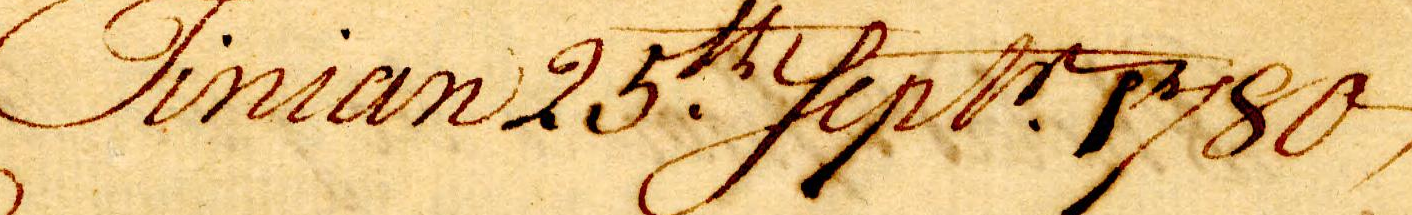Tinian 25^th. Sept^r. 1780
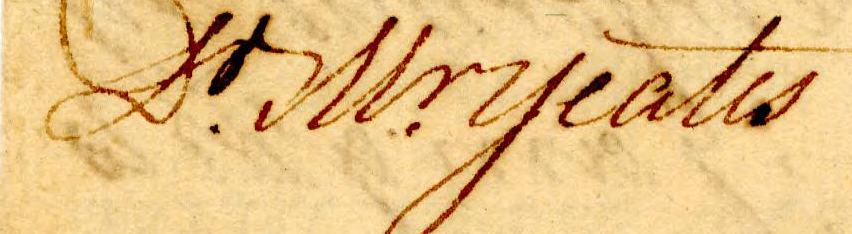D^r. M^r Yeates
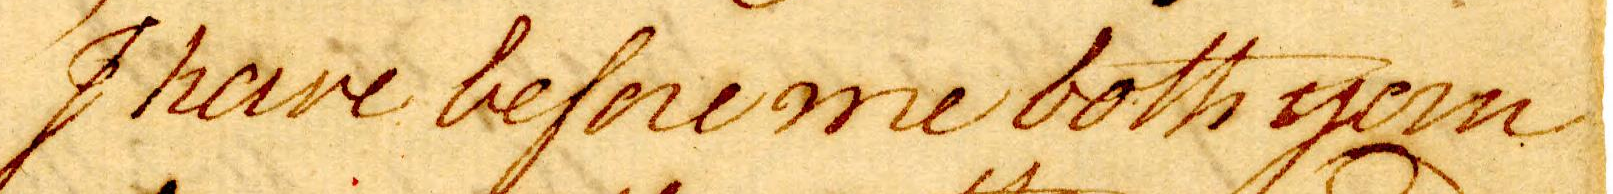I have before me both your
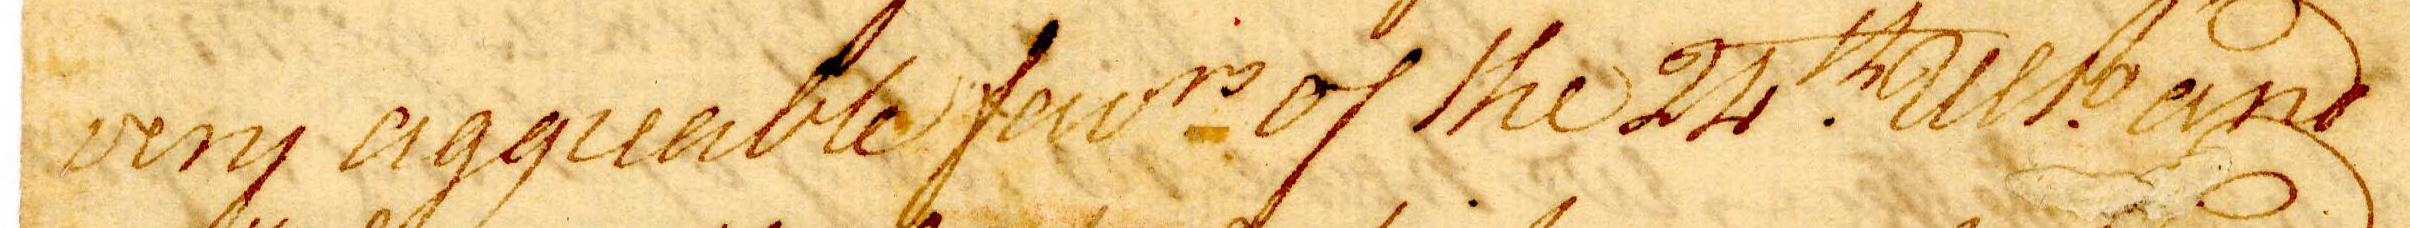very aggreable fav^r of the 24^th. Ult^o. and
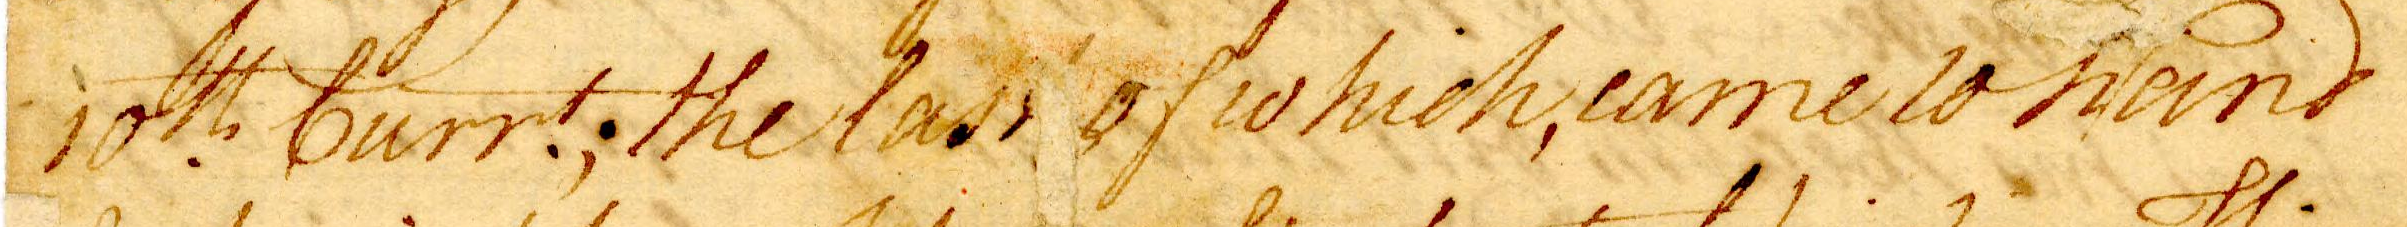10^th Curr^t; the last of which, came to hand
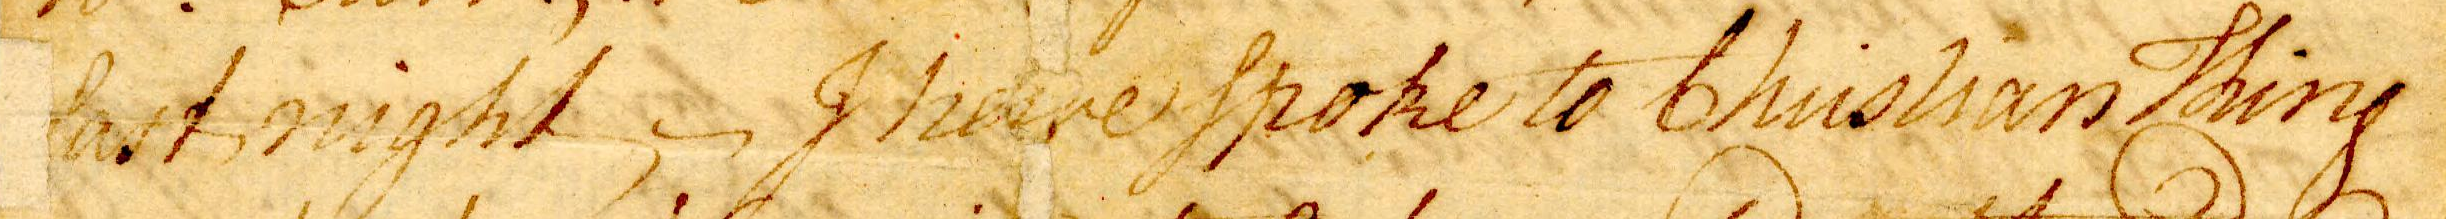last night. I have spoke to Christian Ewing
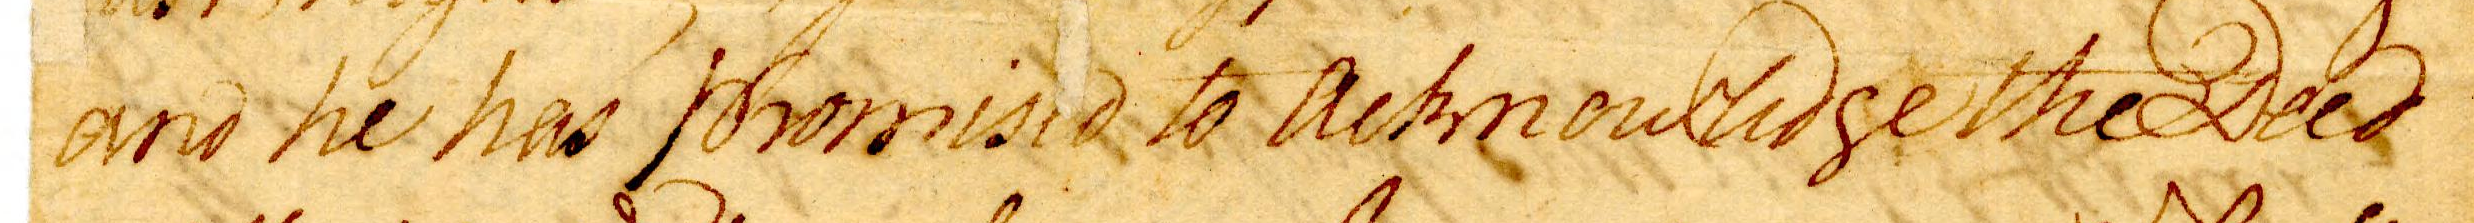and he has promised to Acknowledge the Deed
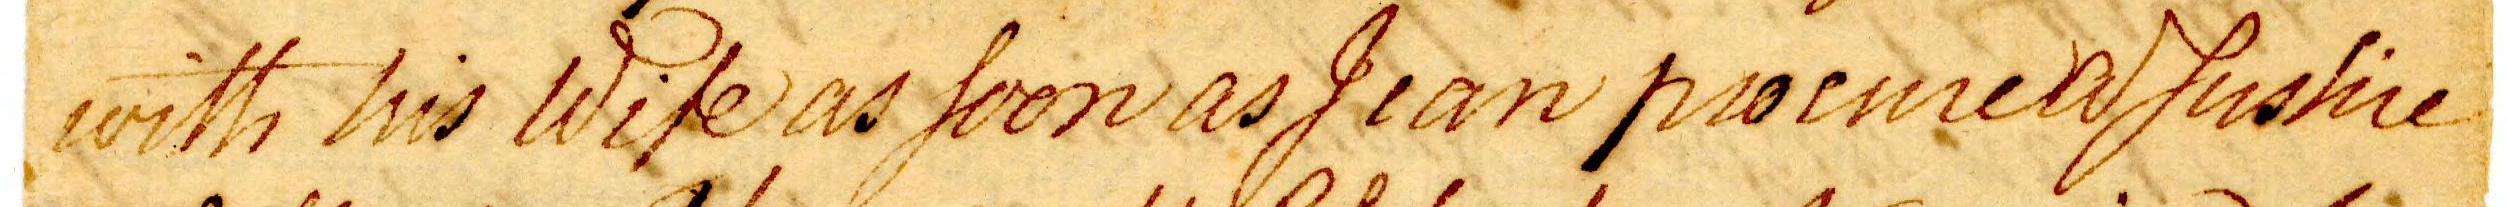with his Wife as soon as I can procure a Justice
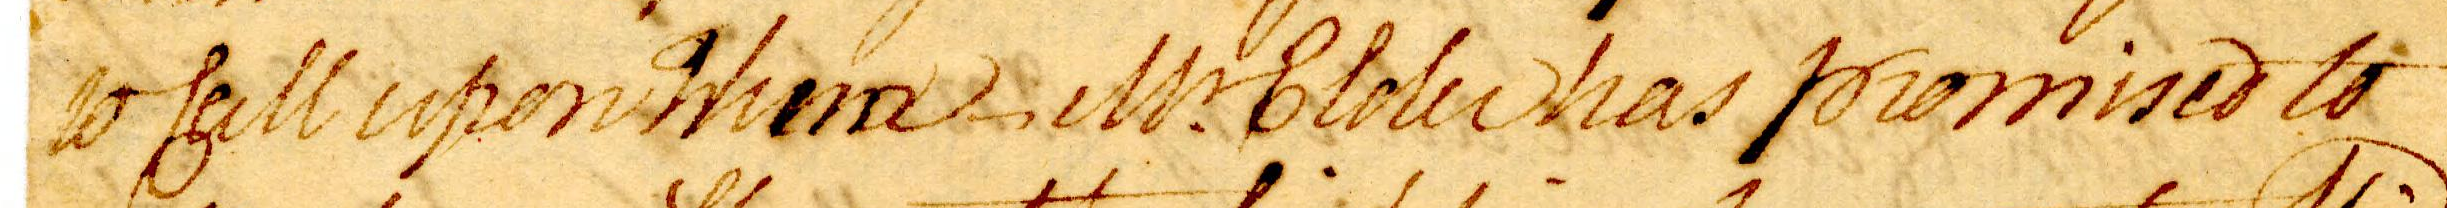to call upon them. M^r. Cloter has promised to
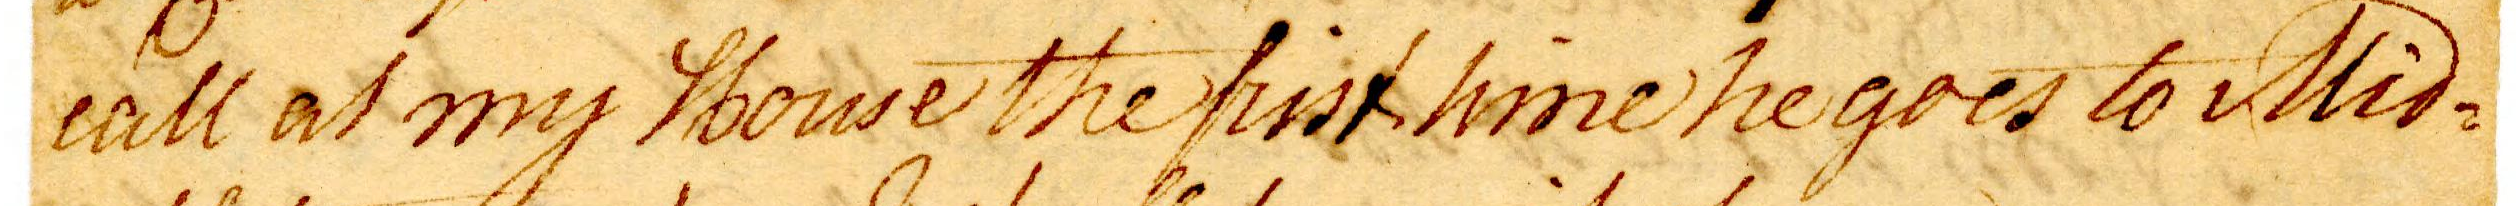call at my House the first time he goes to Mid-
